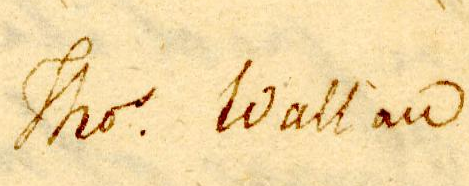Tho. Wallace
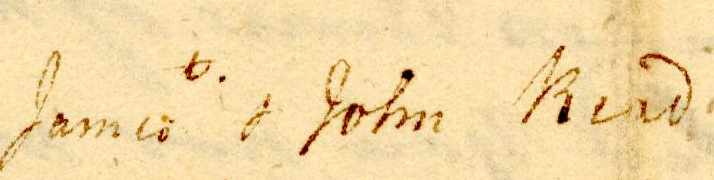James & John Reid
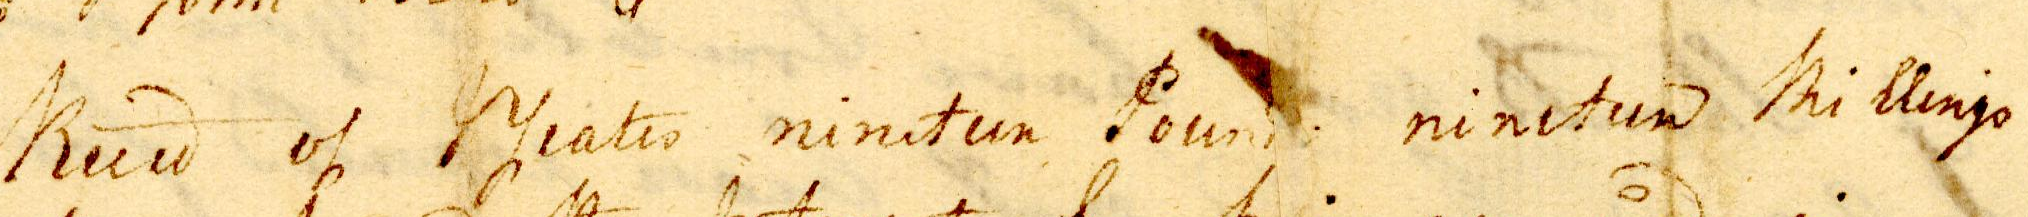Reced of J Yeates nineteen Pounds nineteen Shillings
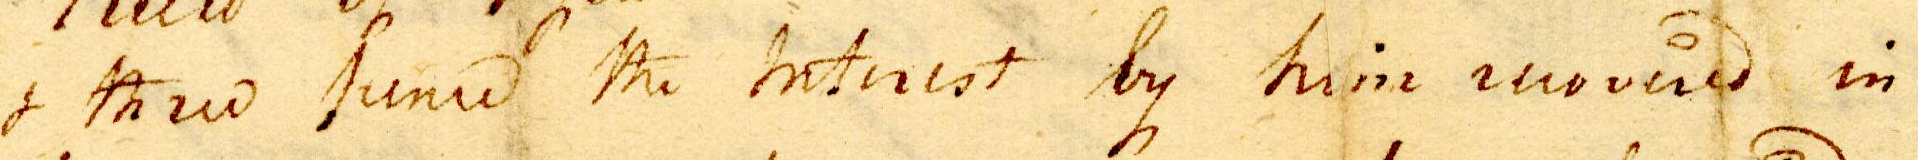& three Pence the Interest by him recovered in
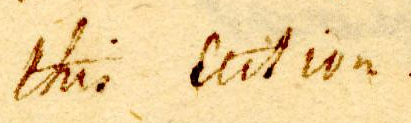this Action.
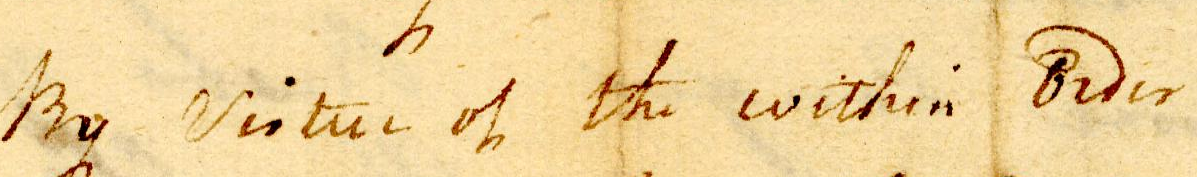By Virtue of the within Order
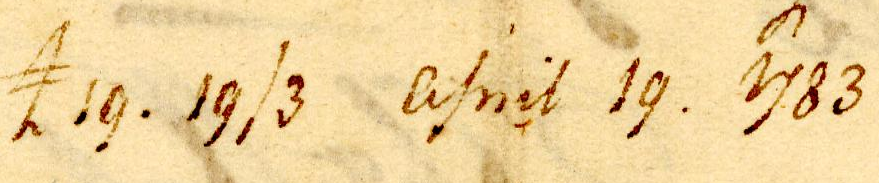£19. 19s3 April 19. 1783
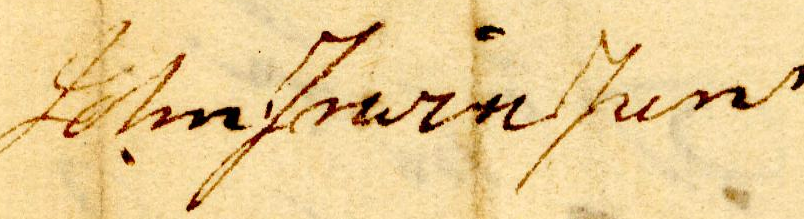John Irwin Jun^r
